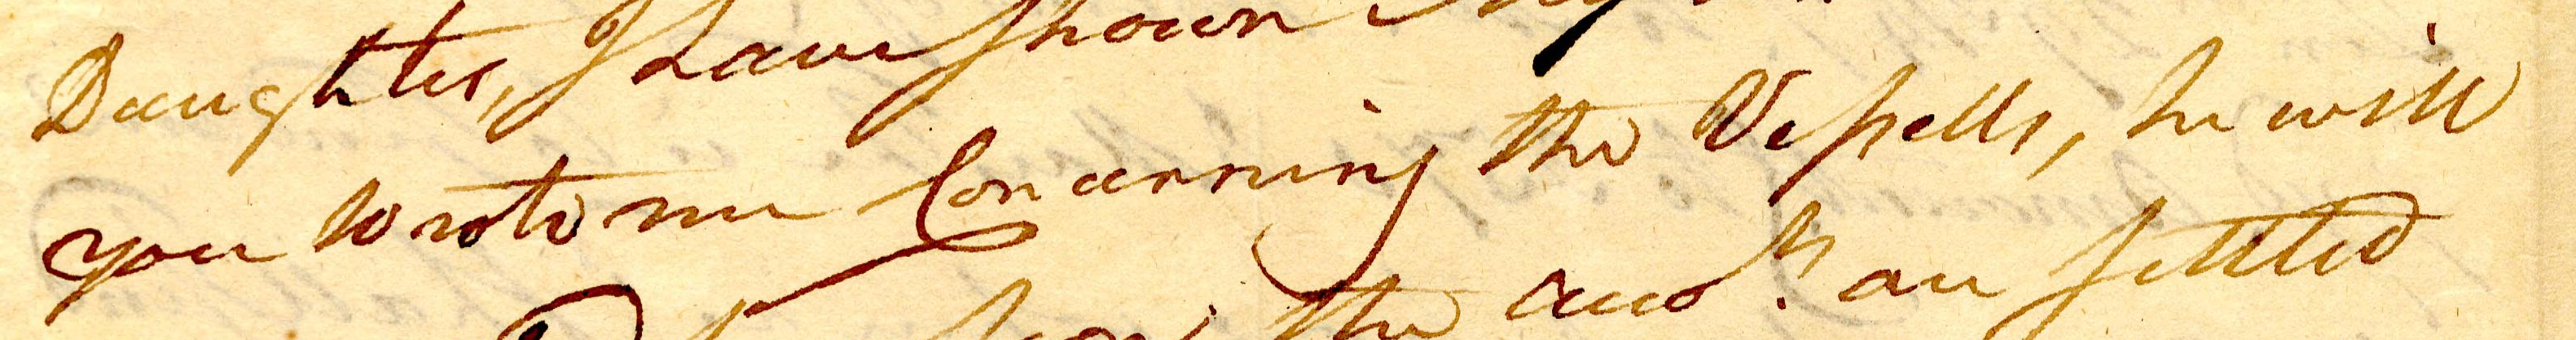you wrote me Concerning the Vessells, he will
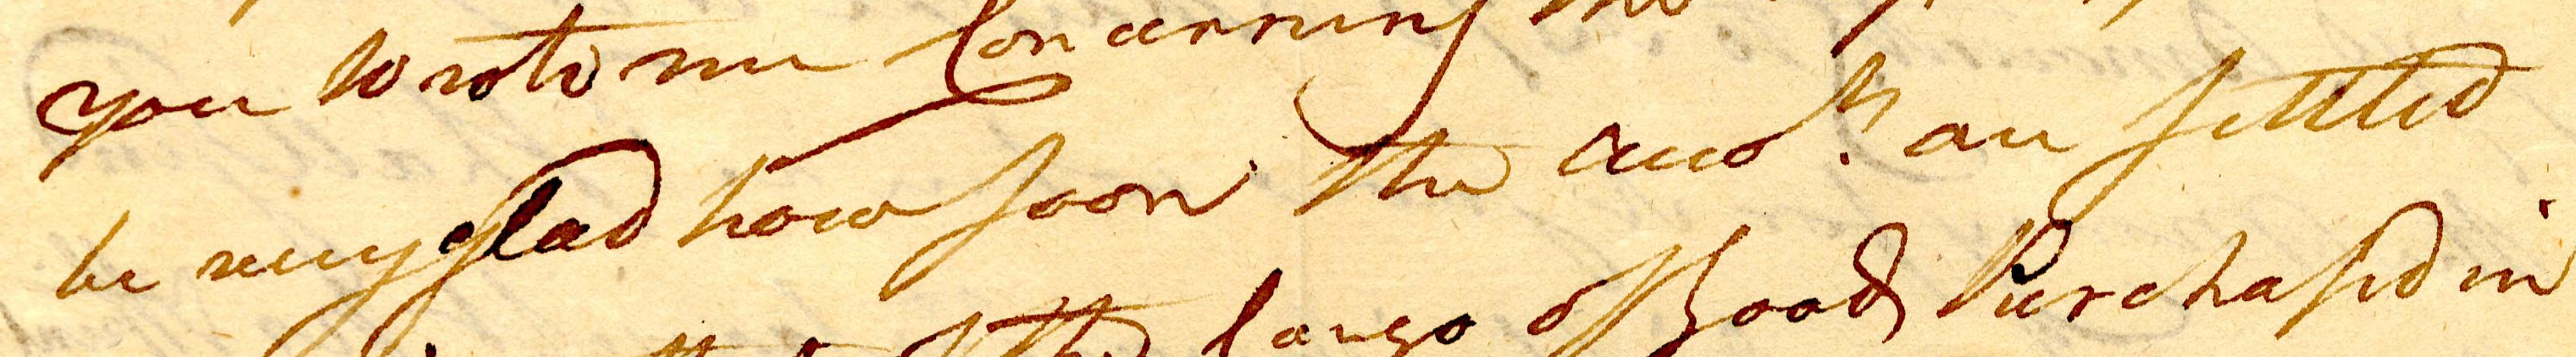be very glad how soon the acco^ts. are settled
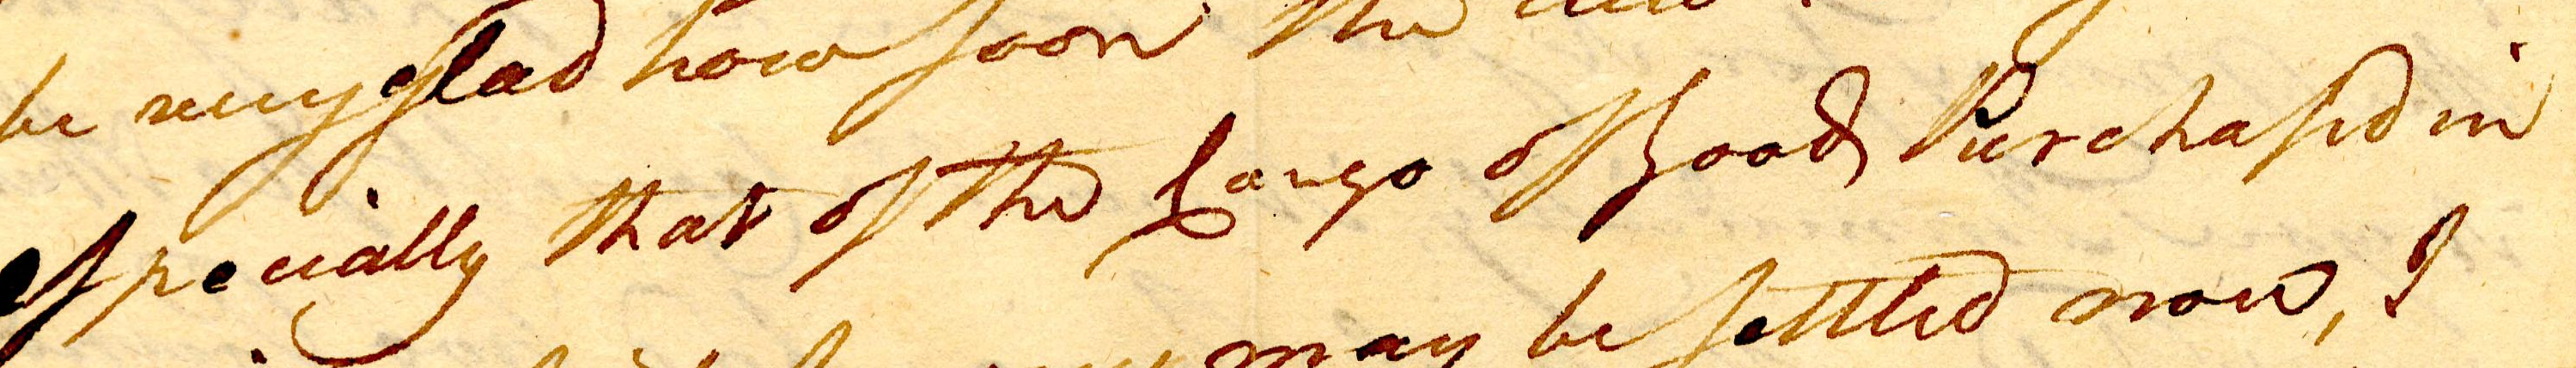especially that of the cargo of goods, Purrchased in
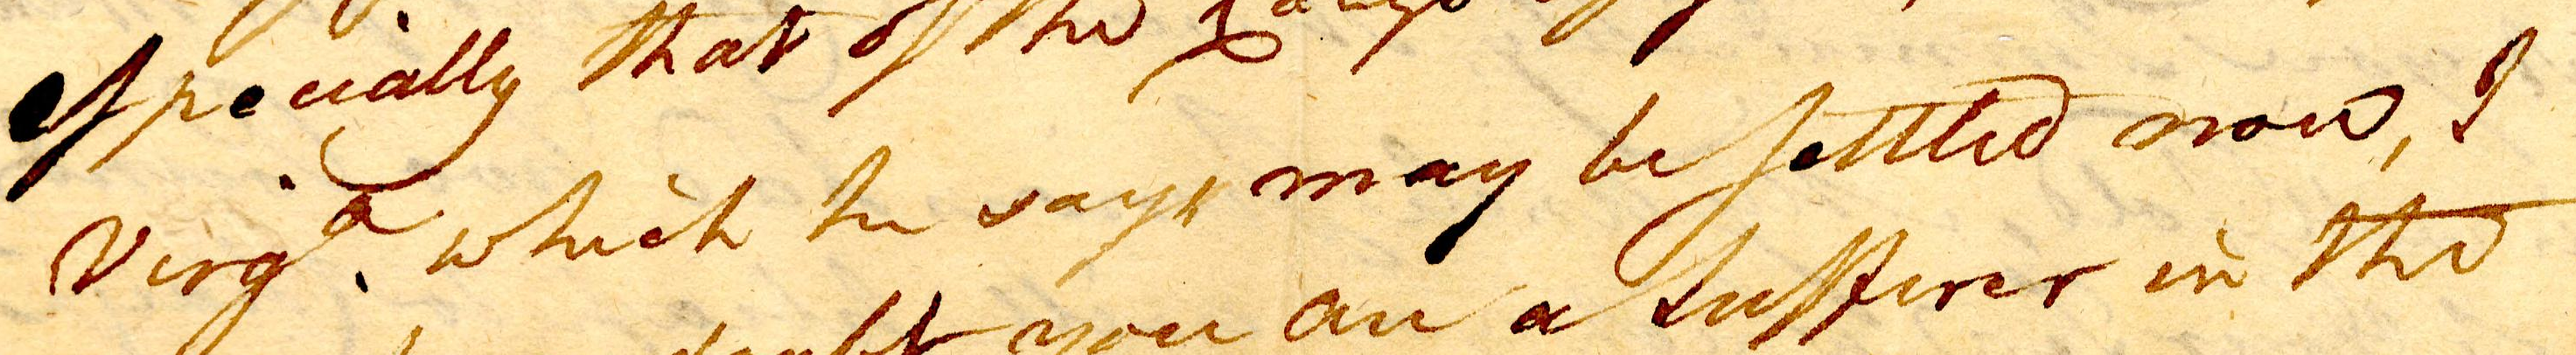Virg^a. which he says may be settled now, I
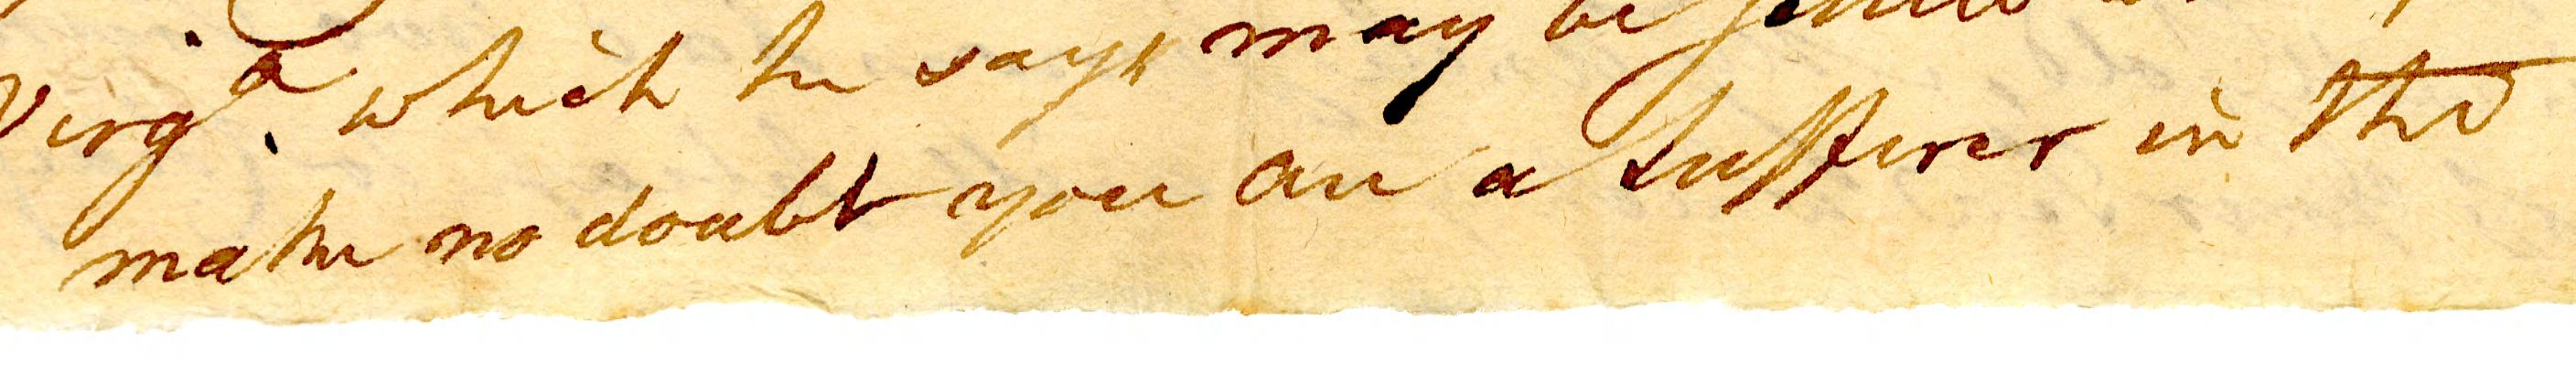make no doubt you are a Sufferer in the
